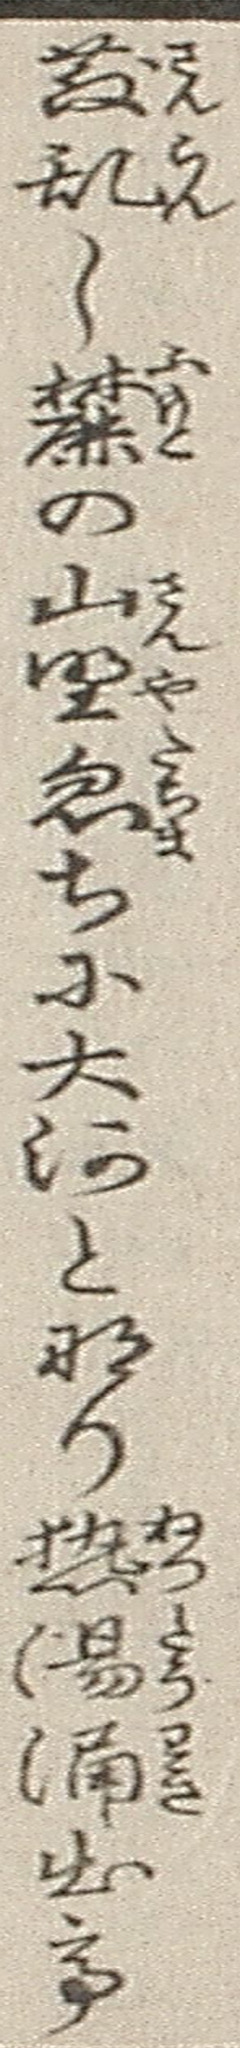散乱し麓の山野忽ちに大河となり熱湯涌出て
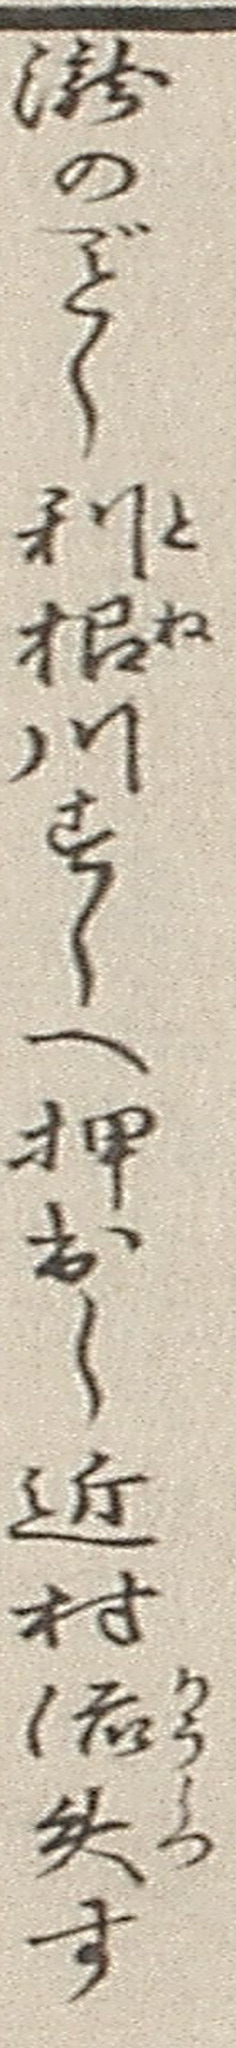瀧のごとし利根川すしへ押出し近村流失す
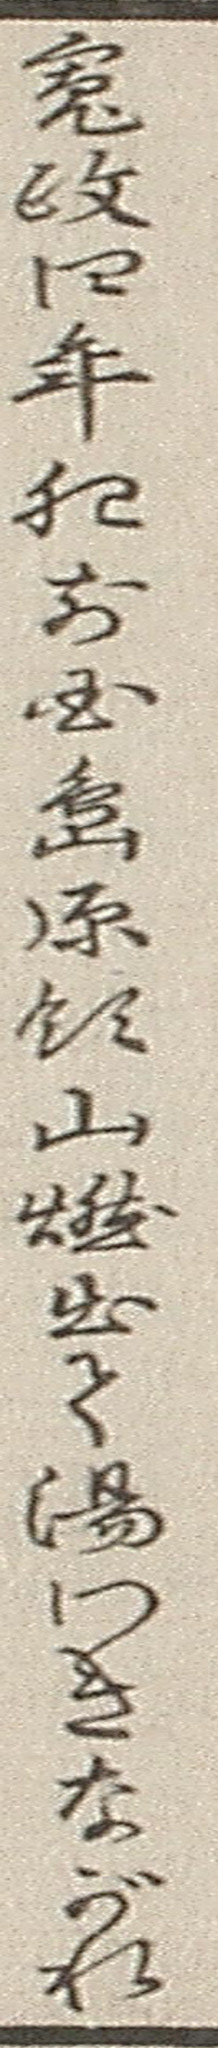寛政四年肥前国島原領山燃出て湯わきながれ
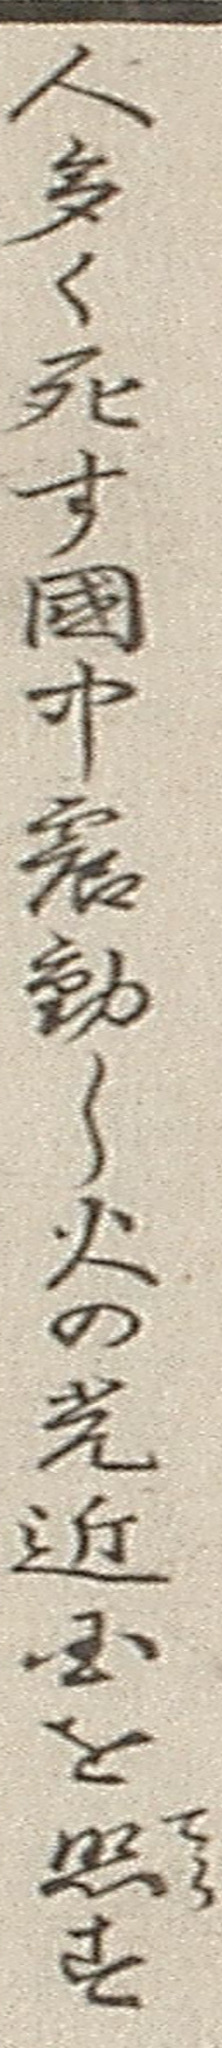人多く死す国中震動し火の光近国を照す
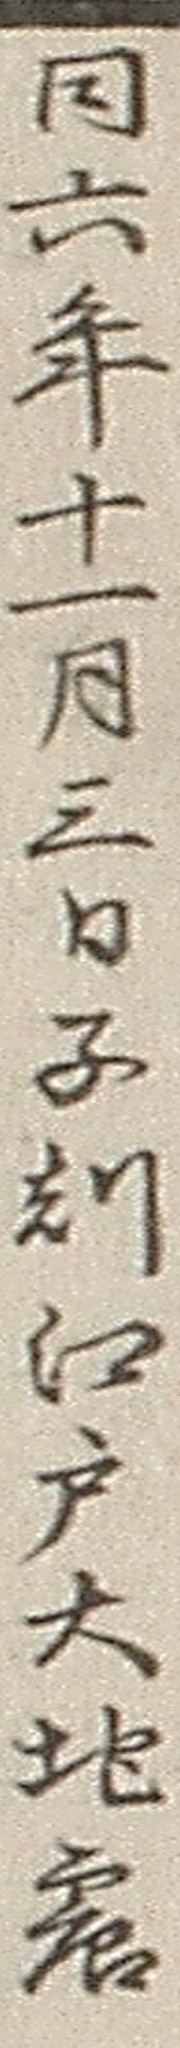同六年十一月三日子刻江戸大地震

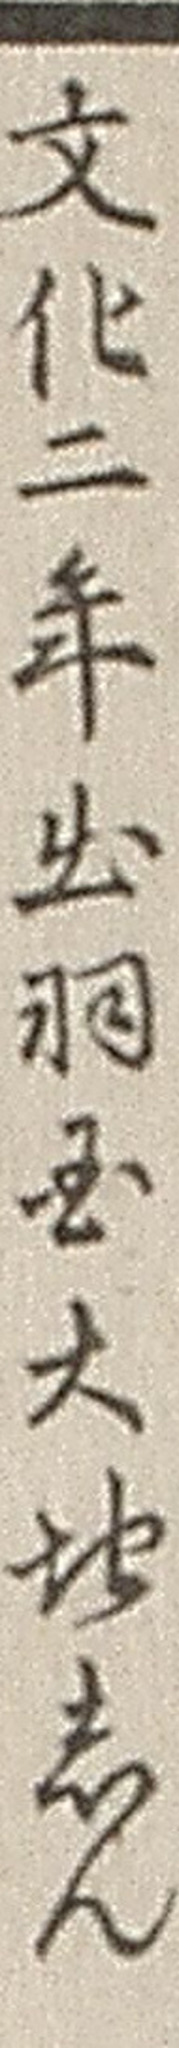文化二年出羽国大地しん
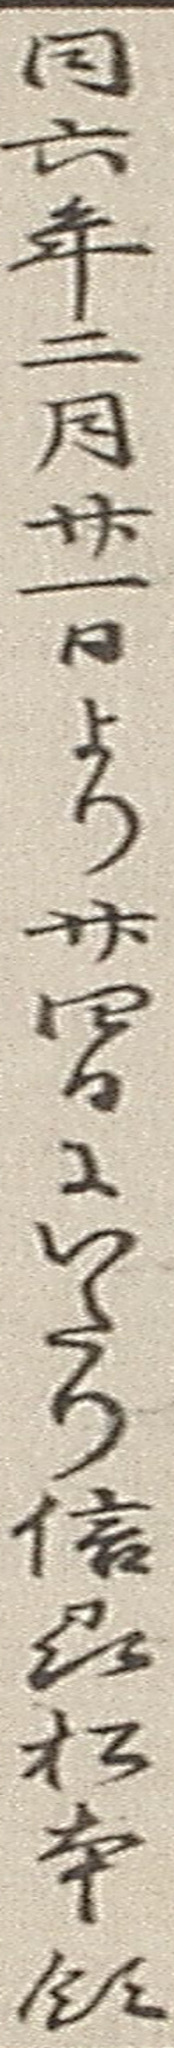同六年二月廿一日より廿四日にいたり信州信州松本領
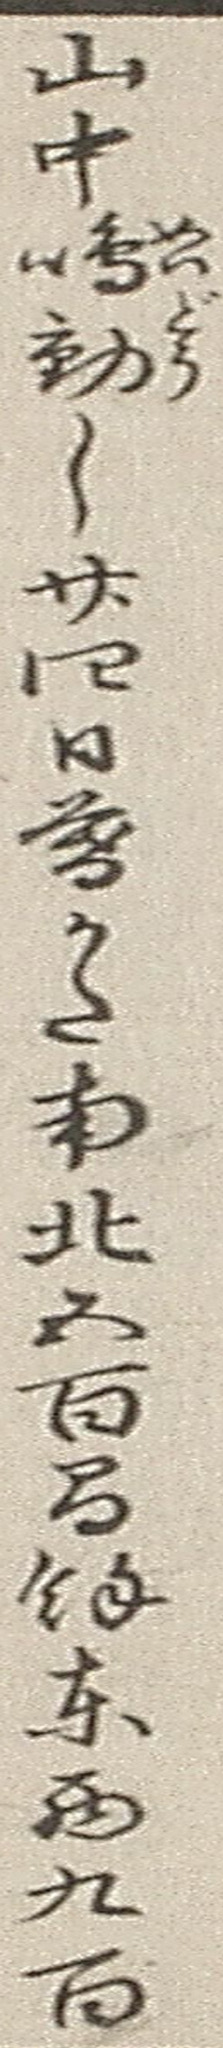山中鳴動し廿四日暮かた南北五百間餘東西九百
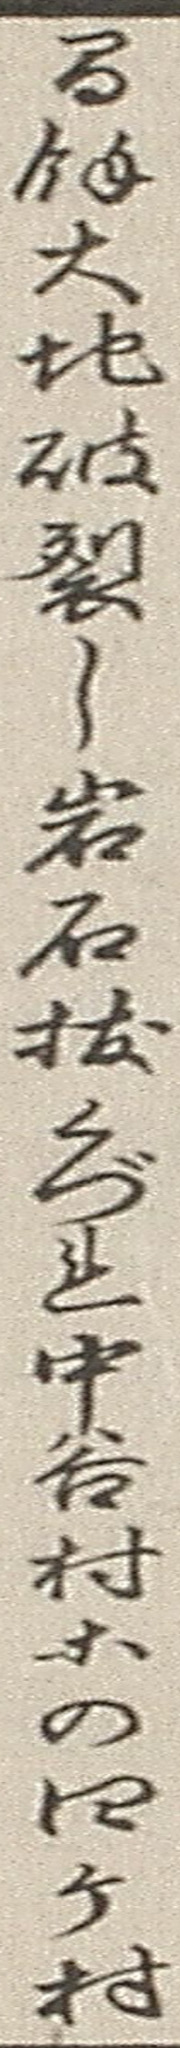間餘大地破裂し岩石抜くづれ中谷村等の四ケ村
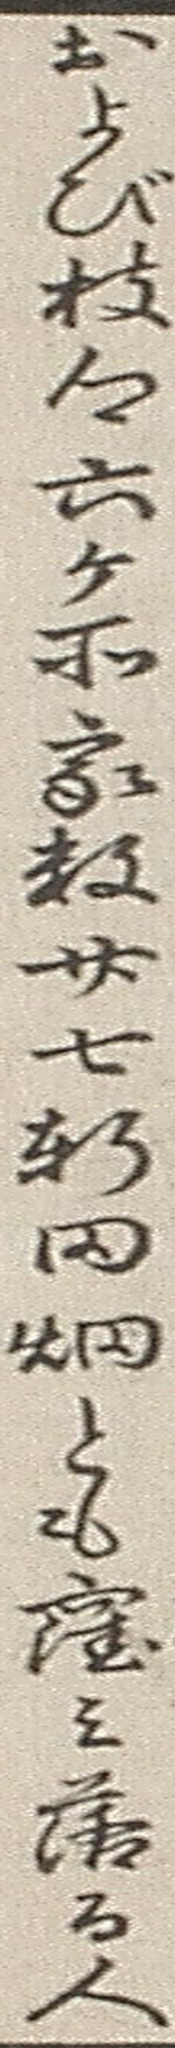および枝郷六ケ所家数廿七軒田畑とも窪ミ落る人
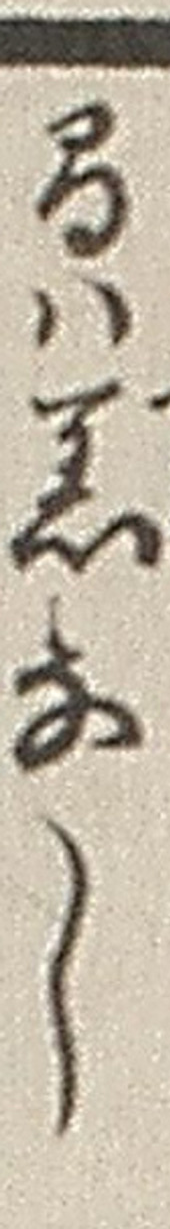間ハ恙なし
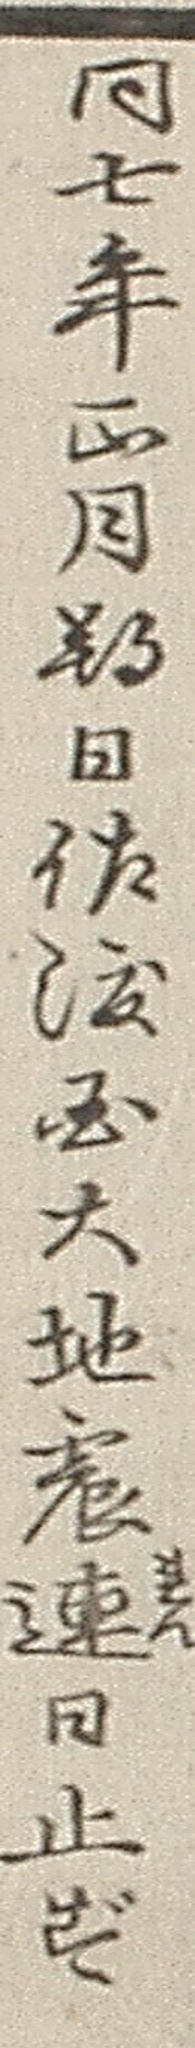同七年正月朔日佐渡国大地震連日止ず
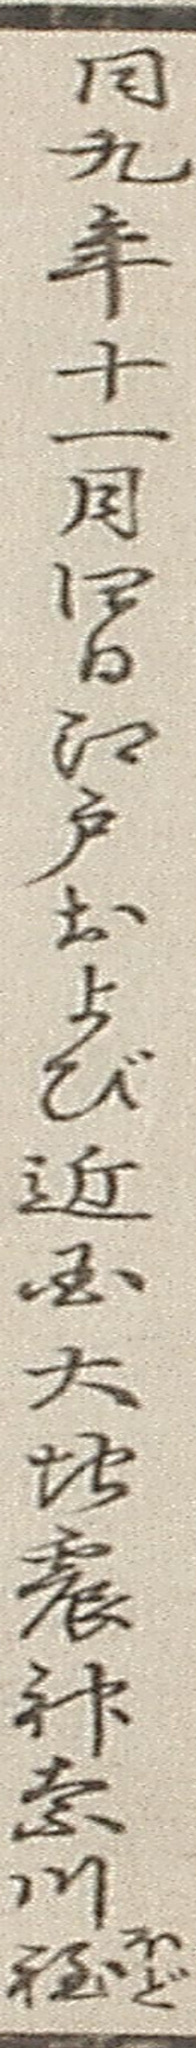同九年十一月四日江戸および近国大地震神奈川程
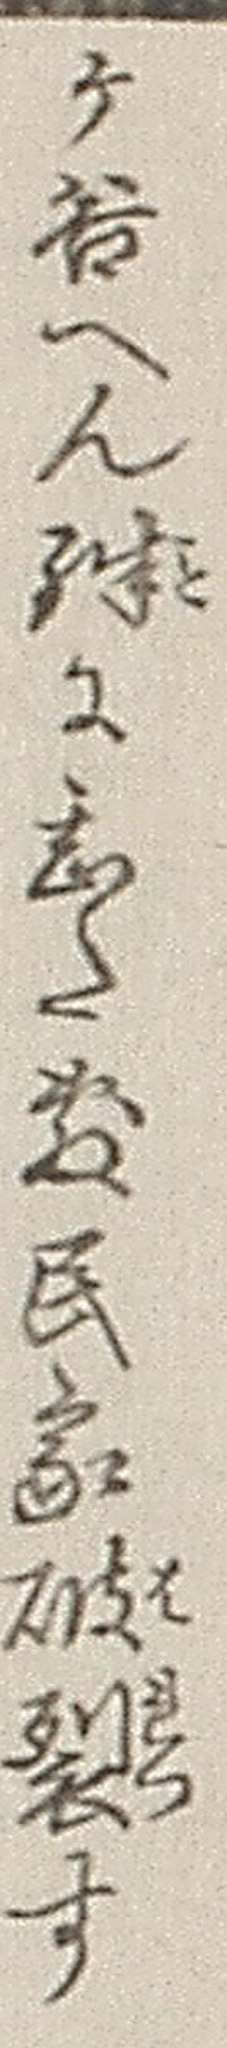ケ谷へん殊に甚た敷民家破裂す
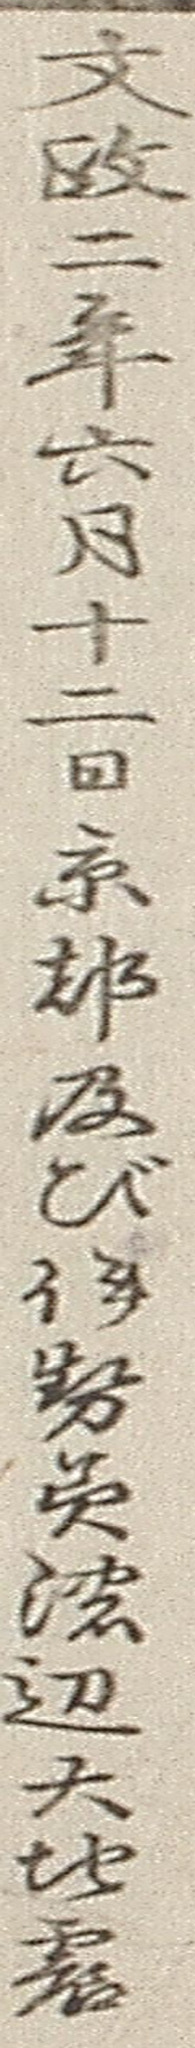文政二年六月十二日京都及び伊勢美濃辺大地震
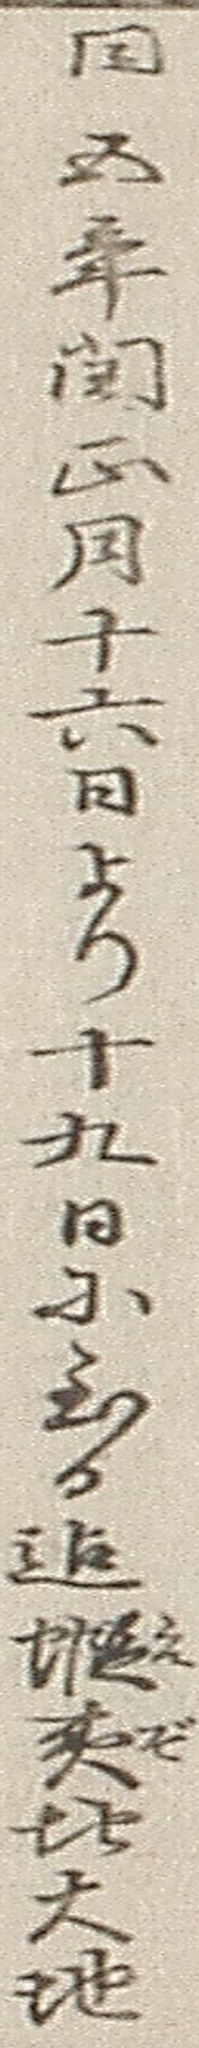同五年閏正月十六日より十九日に至る迄蝦夷地大地
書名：大地震暦年考　全
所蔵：東京大学地震研究所図書室 Earthquake Research Institute Library, The University of Tokyo, JAPAN
